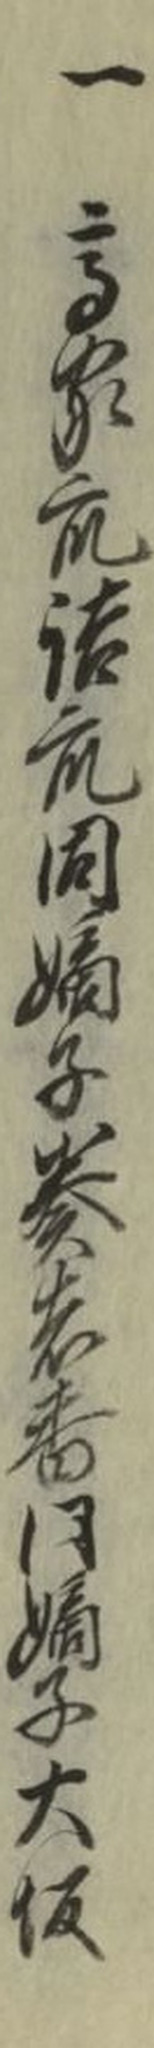一高家衆詰衆同嫡子奏者番同嫡子大坂
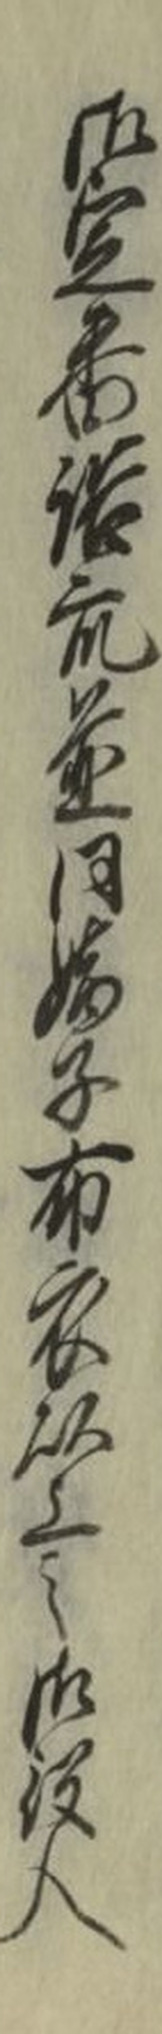御定番詰衆並同嫡子布衣以上之御役人
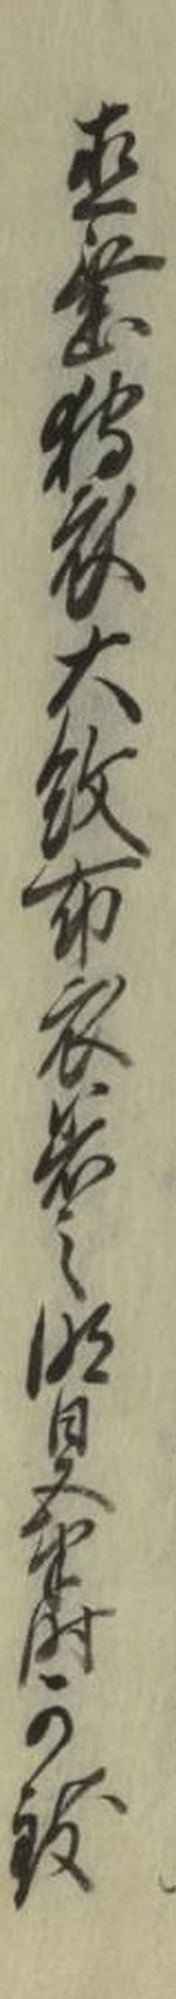直垂狩衣大紋布衣着之明日五半時可致
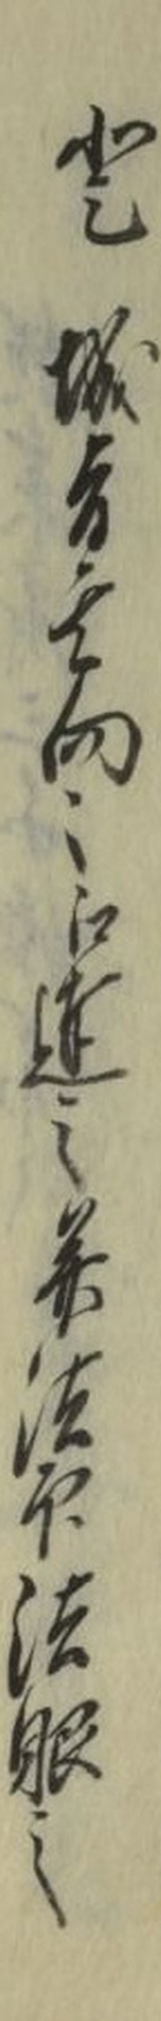登城旨其向々え達之并法印法眼之
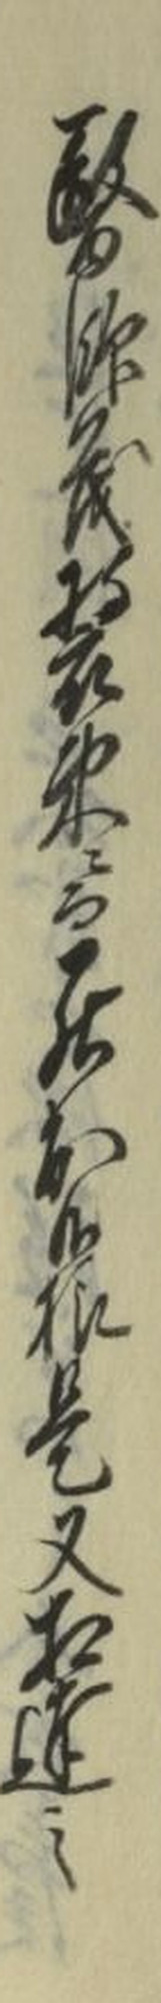医師も装束ニ而罷出候様是又相達之
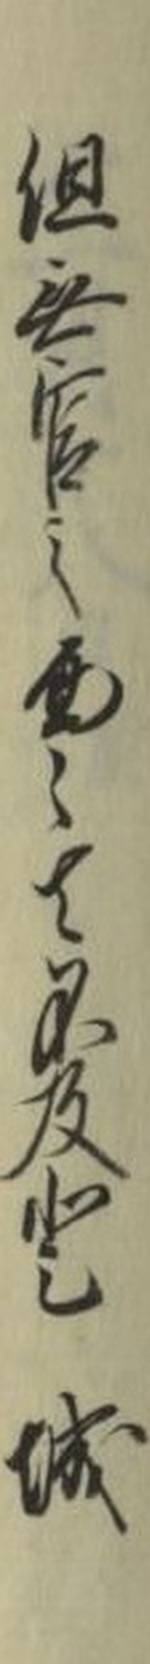但無官之面々は不及登城
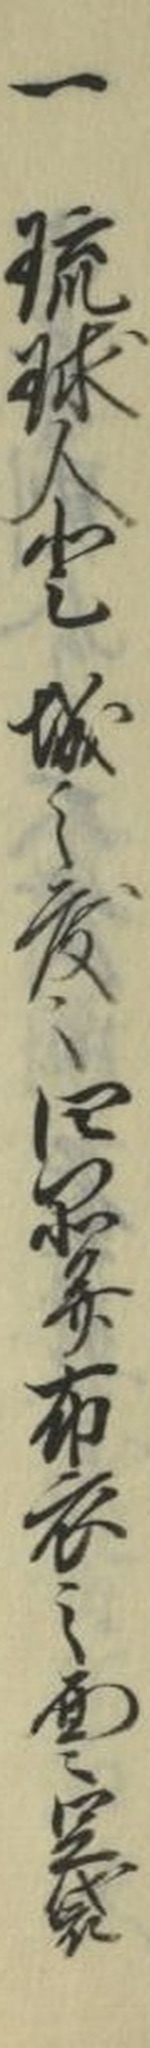一琉球人登城之度之四品并布衣之面々足袋
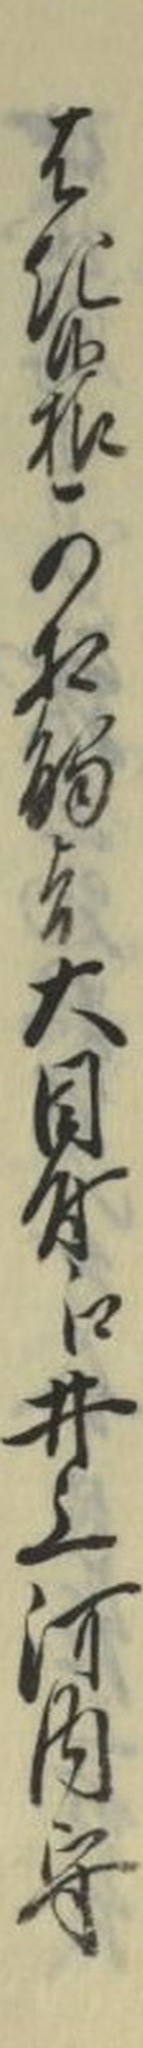はき候様可相觸旨大目付え井上河内守
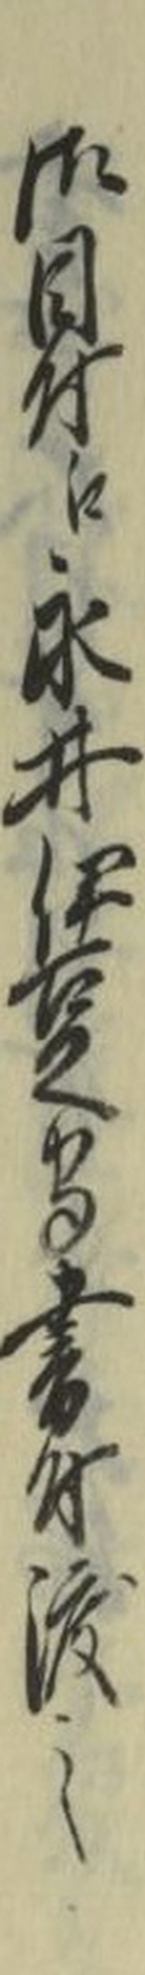御目付え永井伊豆守書付渡之
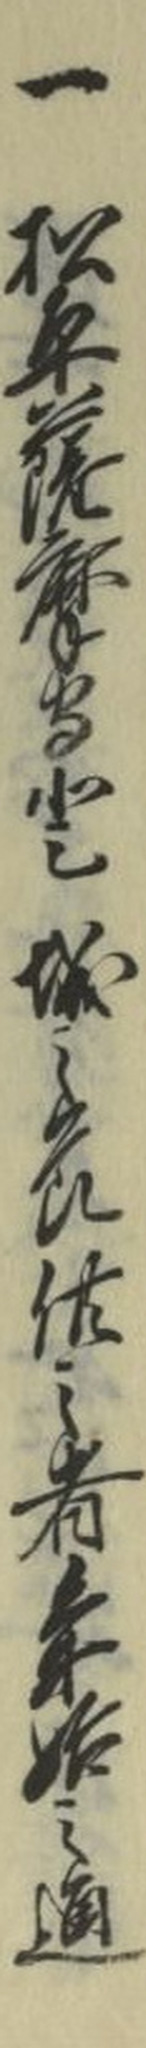一松平薩摩守登城之節供之者年始之通
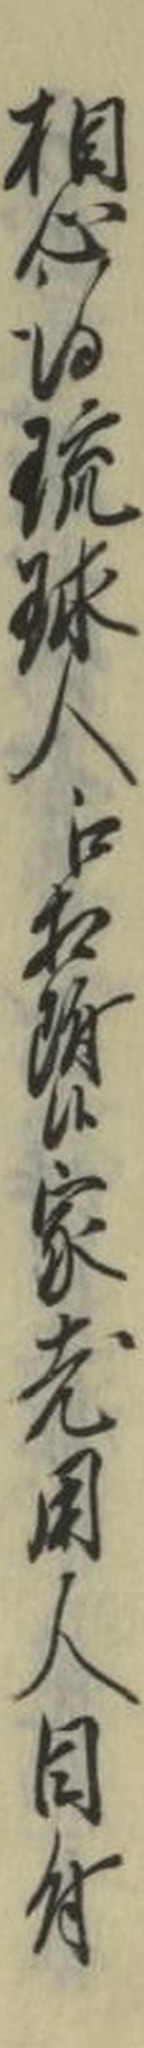相心得琉球人え相附候家老用人目付
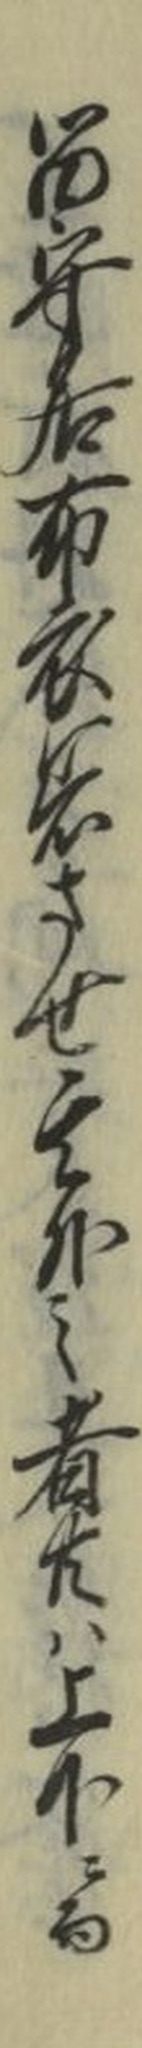留守居布衣着させ其外之者共ハ上下ニ而
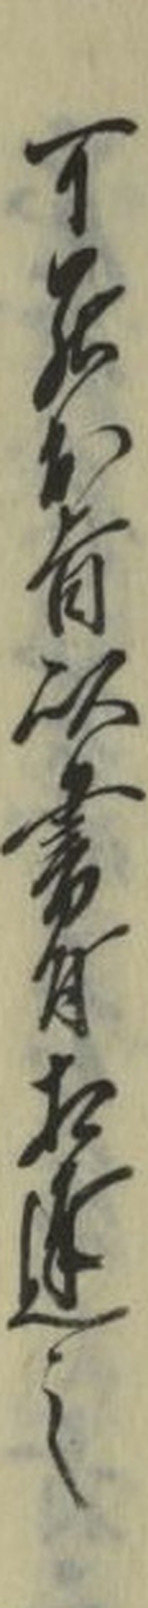可罷出旨以書付相達之

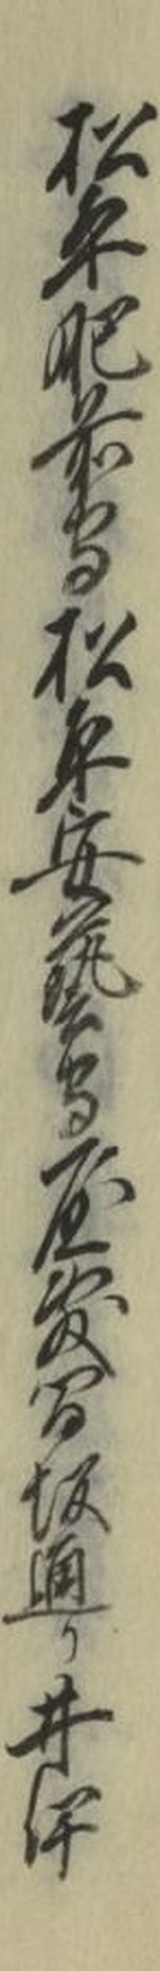松平肥前守松平安芸守屋敷間坂通り井伊
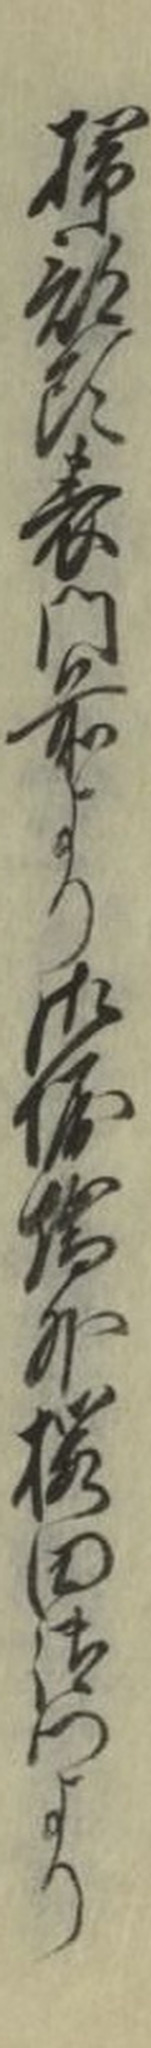掃部頭表門前より御堀端外桜田御門より
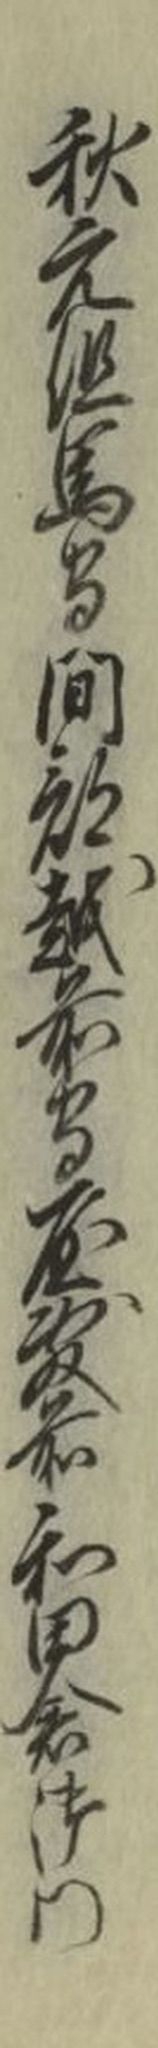秋元但馬守間部越前守屋敷前和田倉御門
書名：琉球人参府記
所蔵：University of the Ryukyus Library
